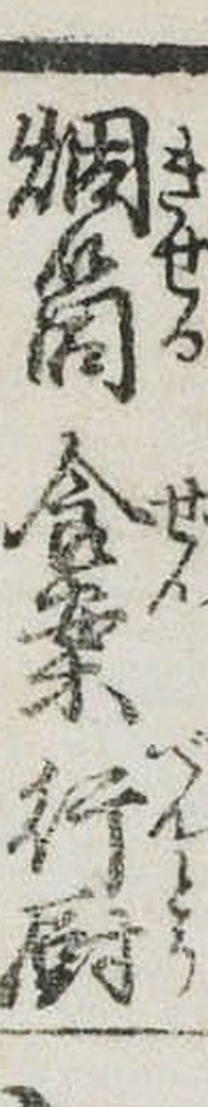烟筒食案行厨
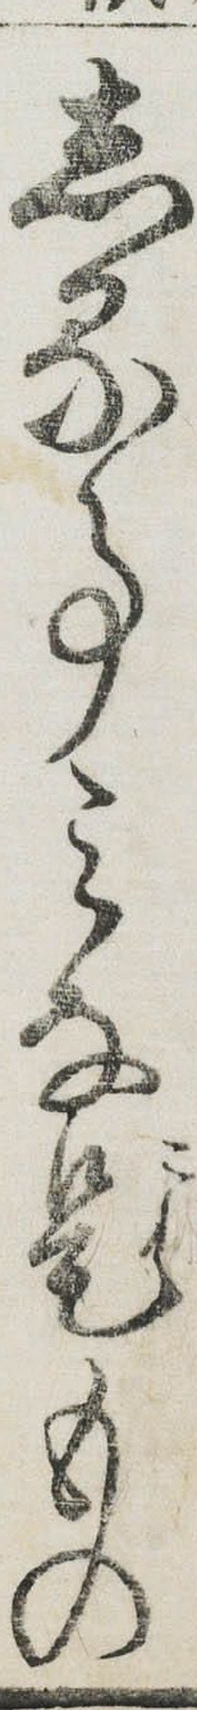しる事みな是もの
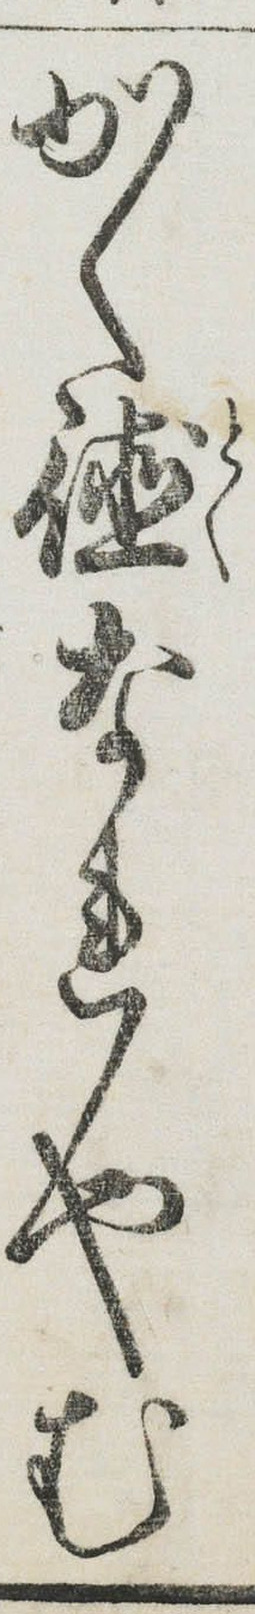かく徳なれやむ
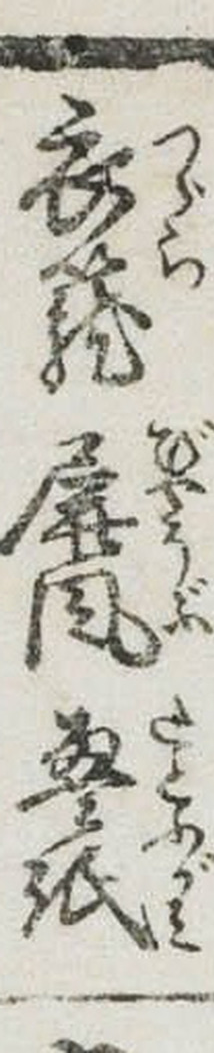衣籠屏風畳紙
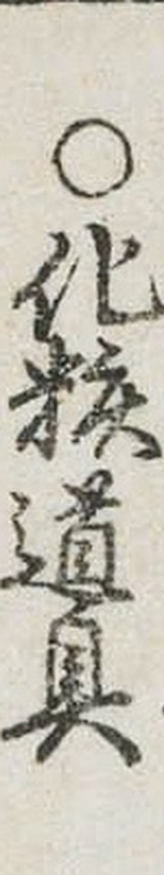○化粧道具
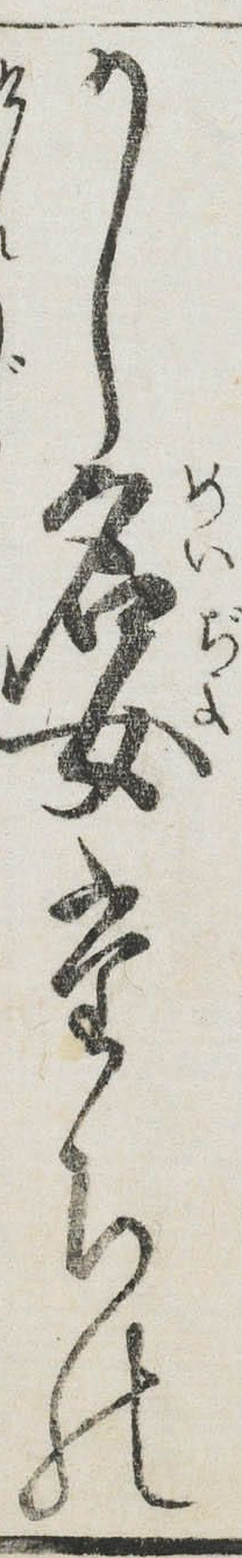かし名女たちの
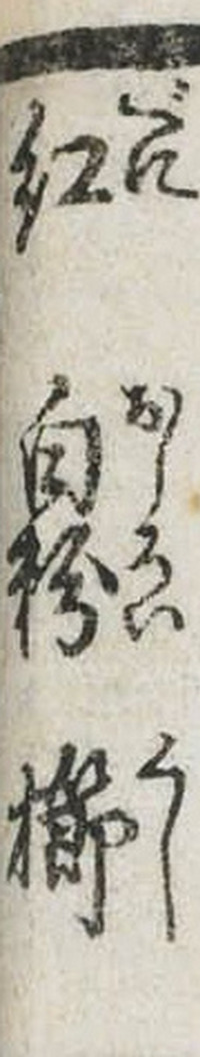紅白粉櫛
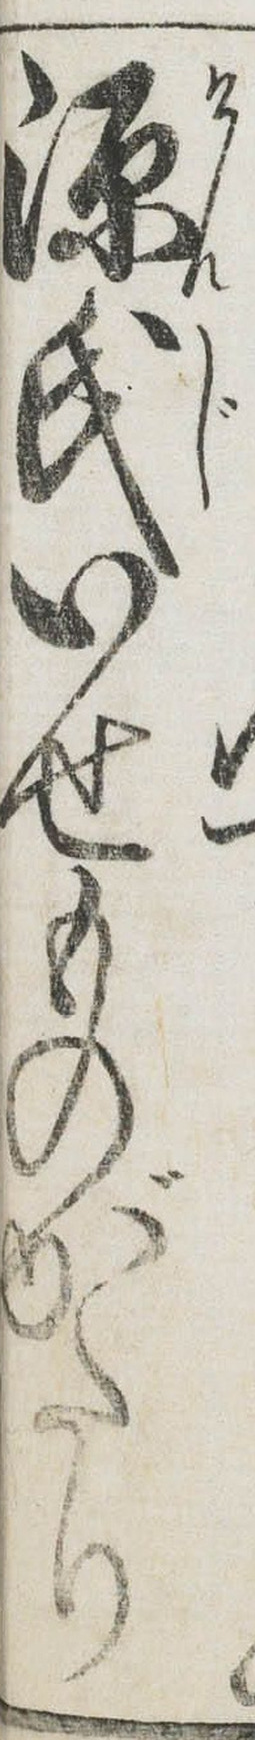源氏いせものがたり
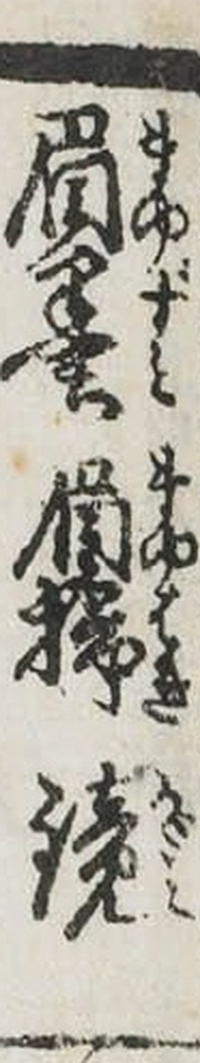眉墨眉掃鏡
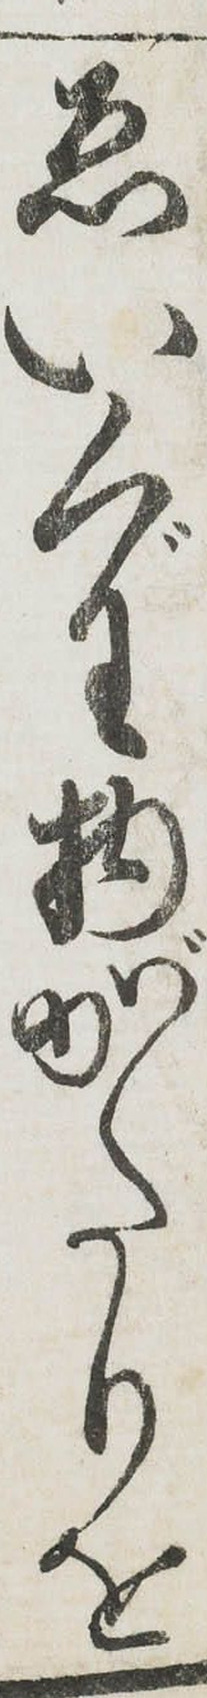ゑいぐわ物がたりを
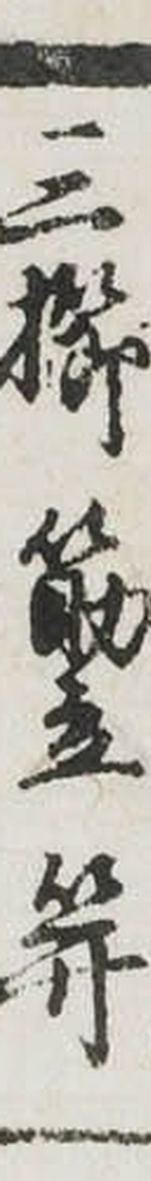三櫛筋立笄
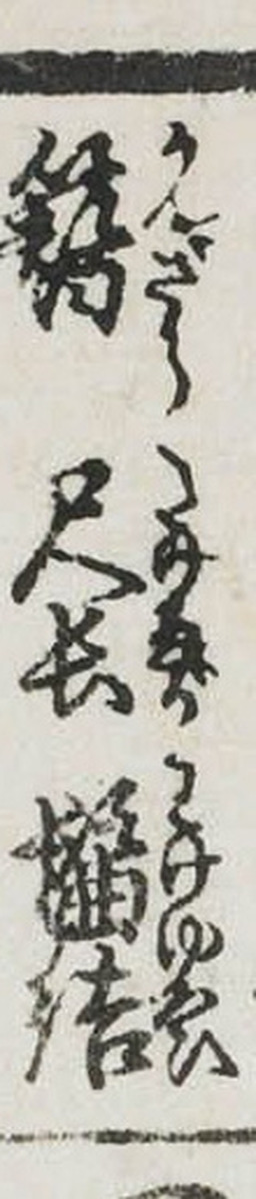簪尺長髷結
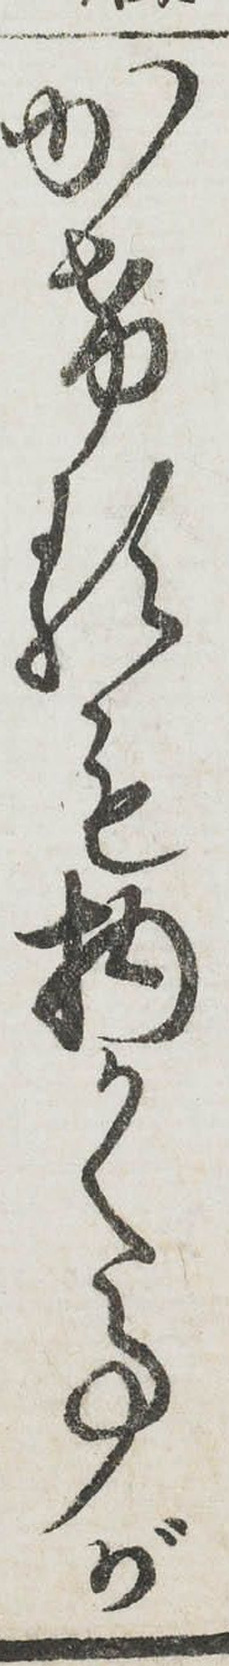かけるも物かく事が
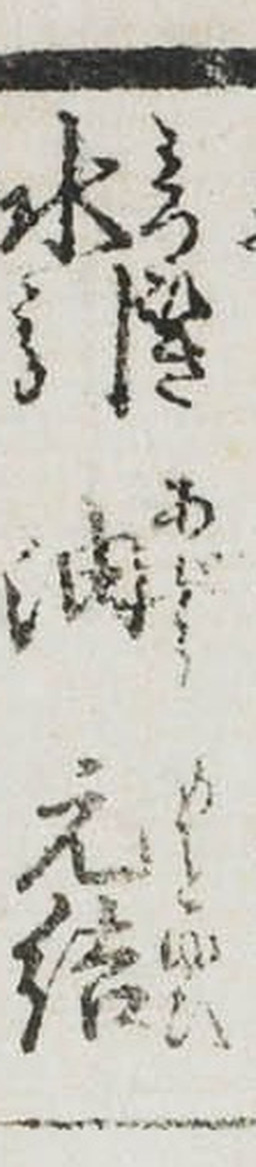水引油元結
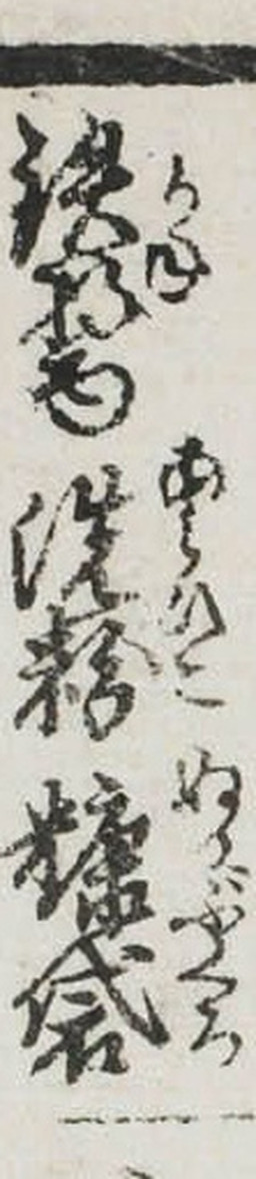鉄醤洗粉糠袋
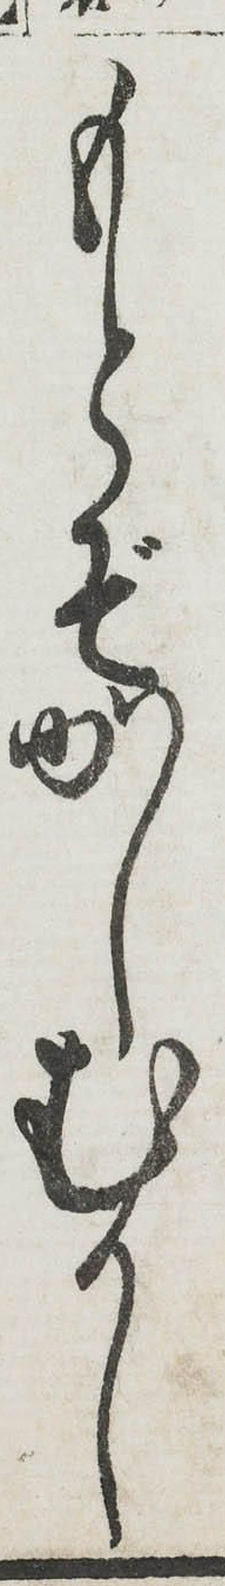もとぞかしむかし
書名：頭書萬用婦人手紙之文言
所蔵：東京学芸大学教育コンテンツアーカイブ
